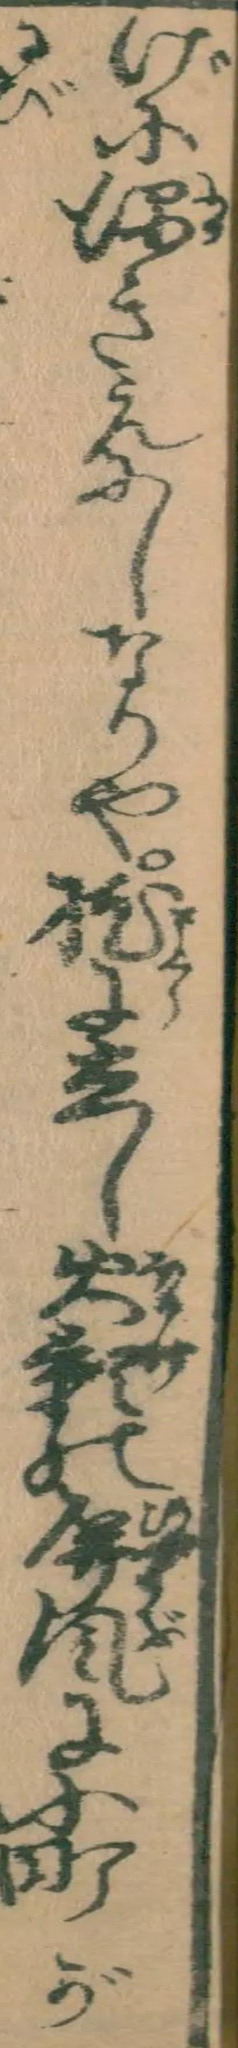げに深きえにしなりや。枕に立し火影の屏風に小町が
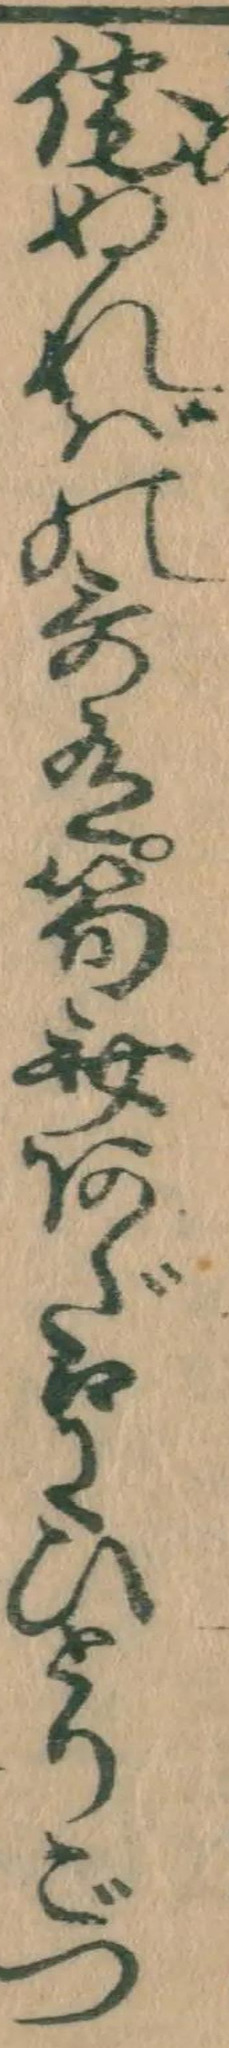侘ぬればの歌有。筍斎あだ口にひとりごつ
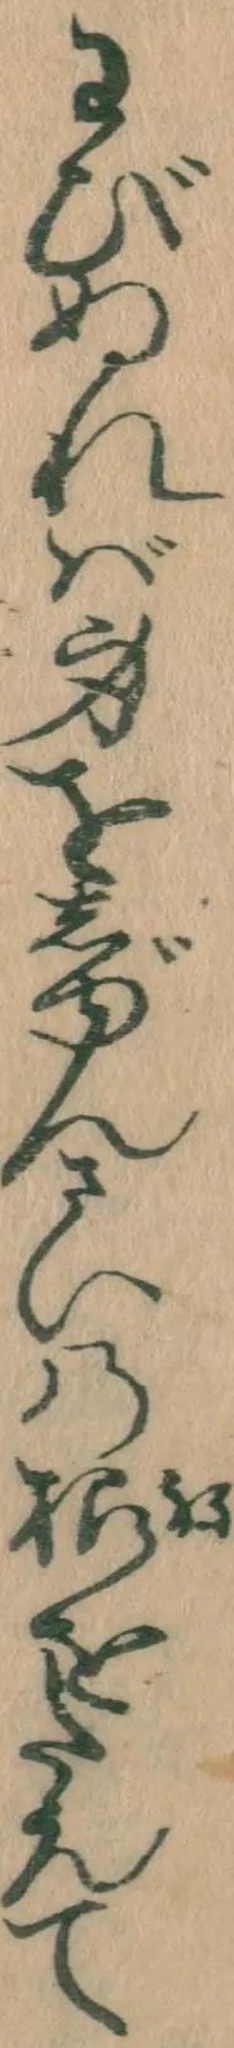わびぬれば身をじゆんさいの根をたえて
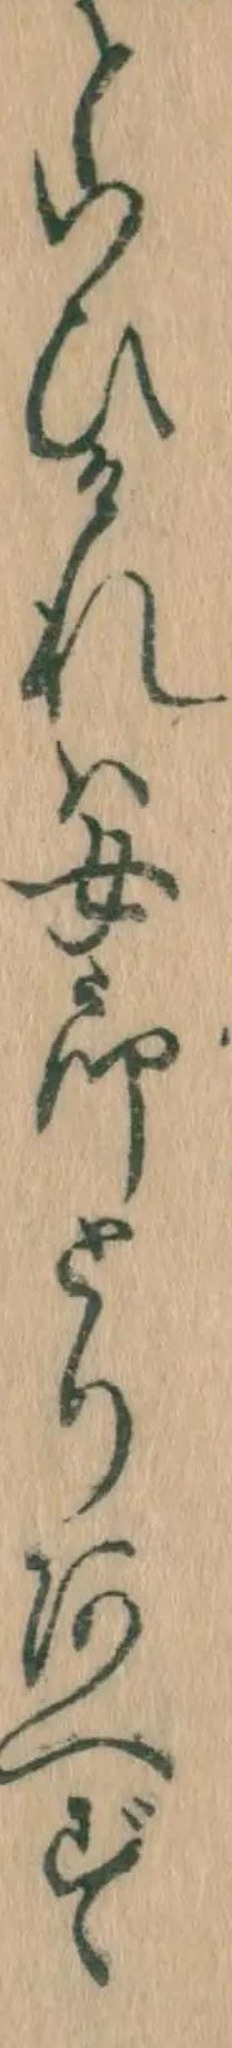といひけれは女郎とりあへず
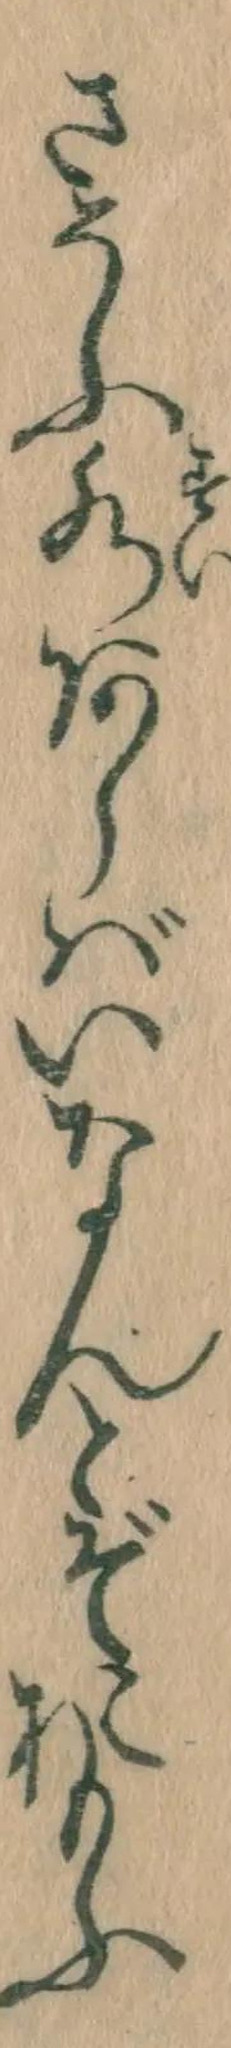さそふ水あらばいなんとぞおもふ
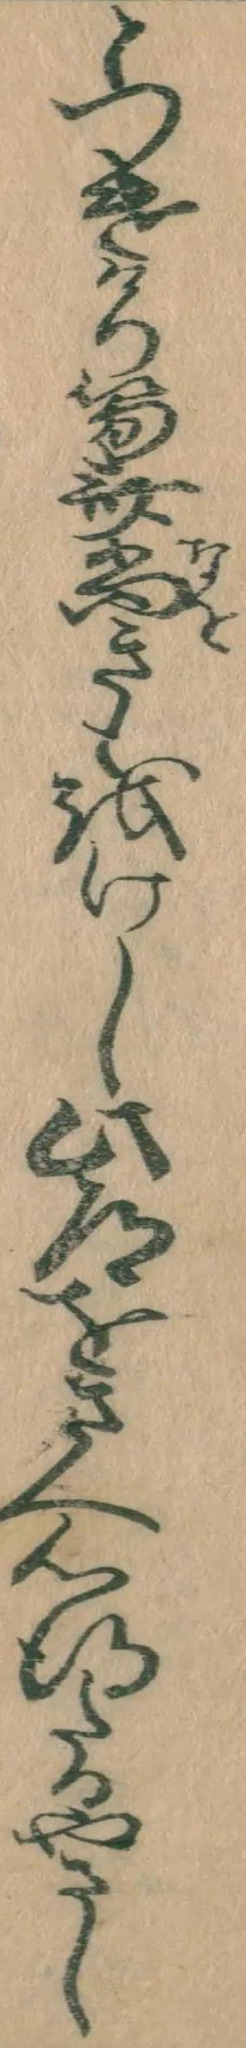とつけけり筍斎尚きもをけし此道をさへ心得たるやさし
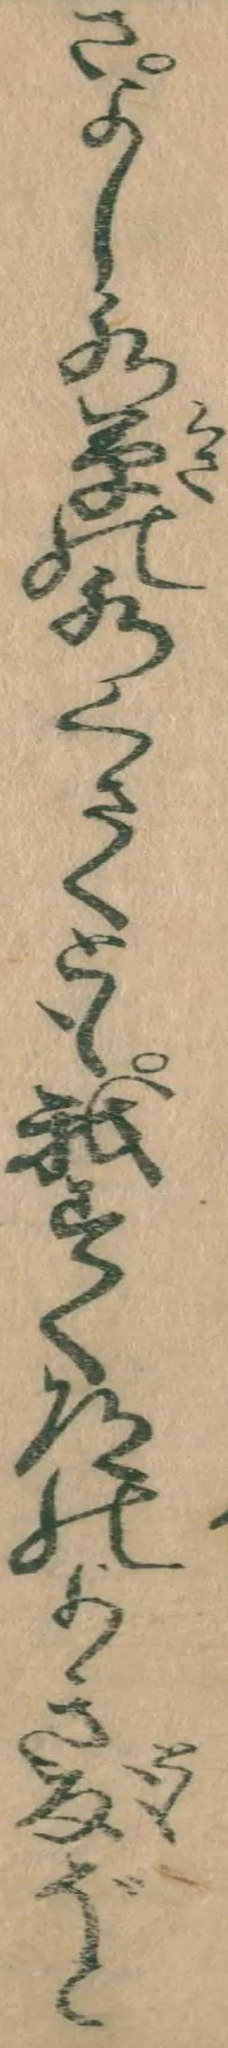さ。よし水草の水くさくとも。我すく道のよき友ぞと
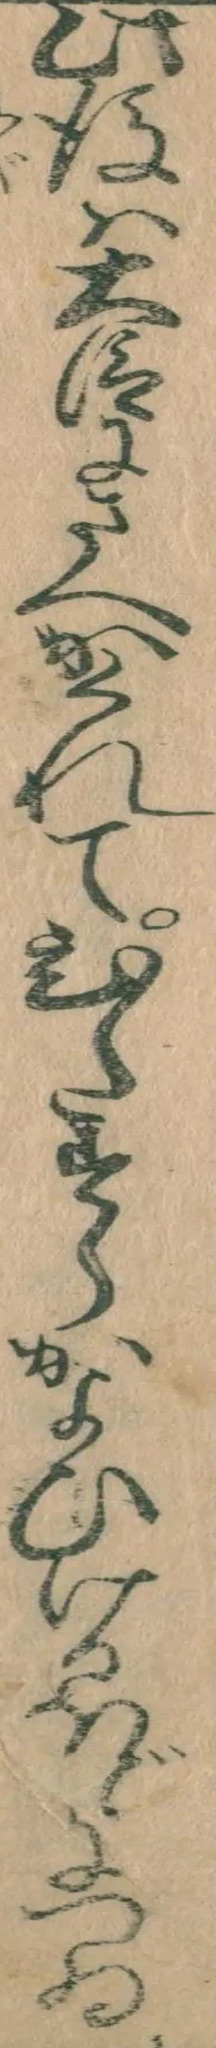此後は大臣にさへかくれて。ひたすらかよひけるほどにつゐ
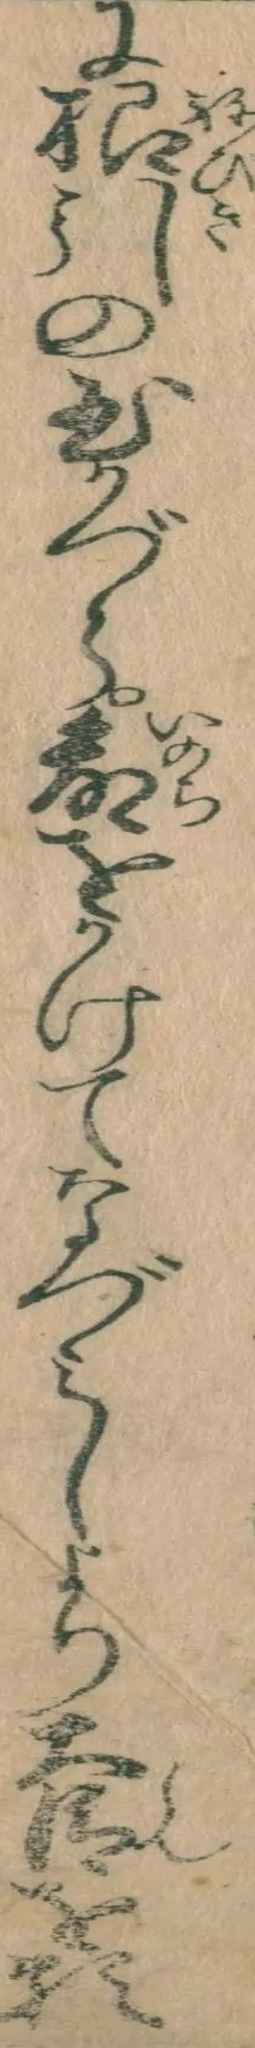に根引の玉かづら。命をかけてなづみしより大臣を頼
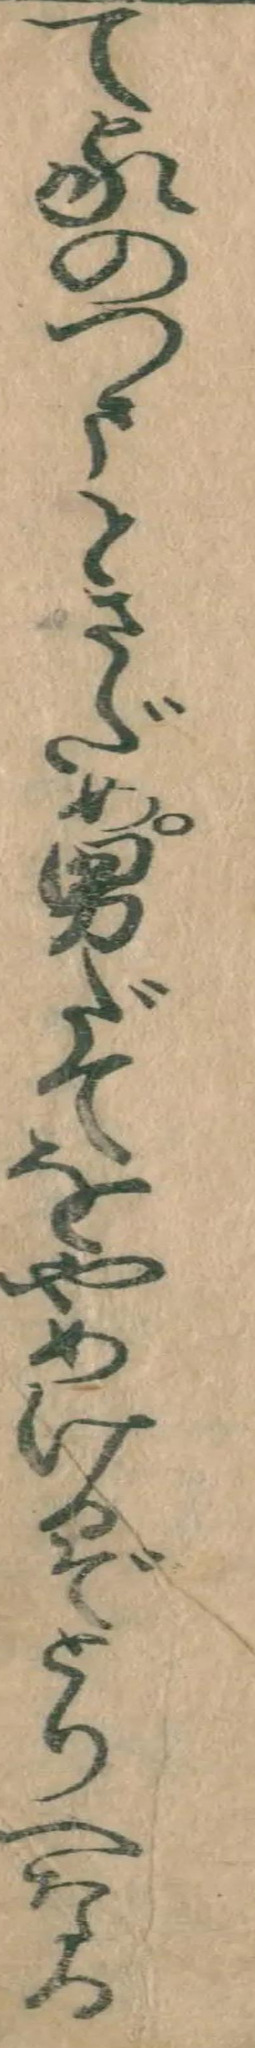て家のつまとさだめ。男だてをやめけるぞとりへなる
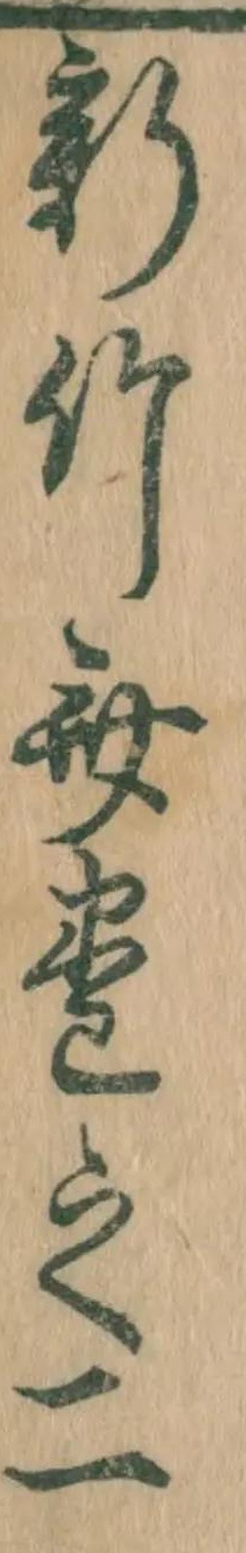新竹斎巻之二

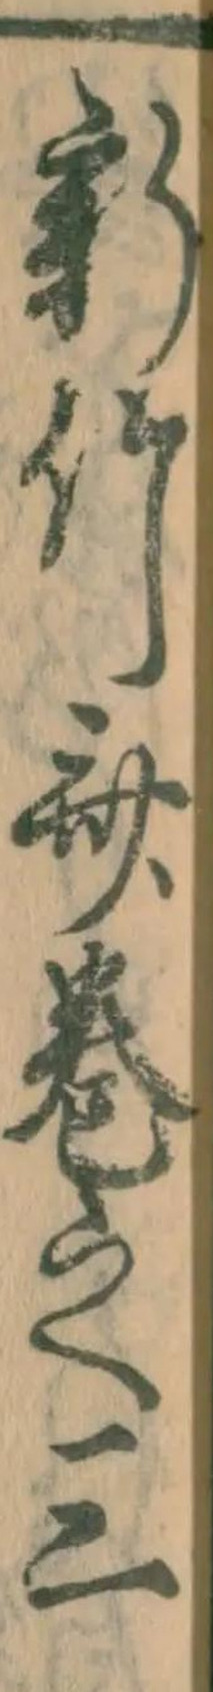新竹斎巻之三
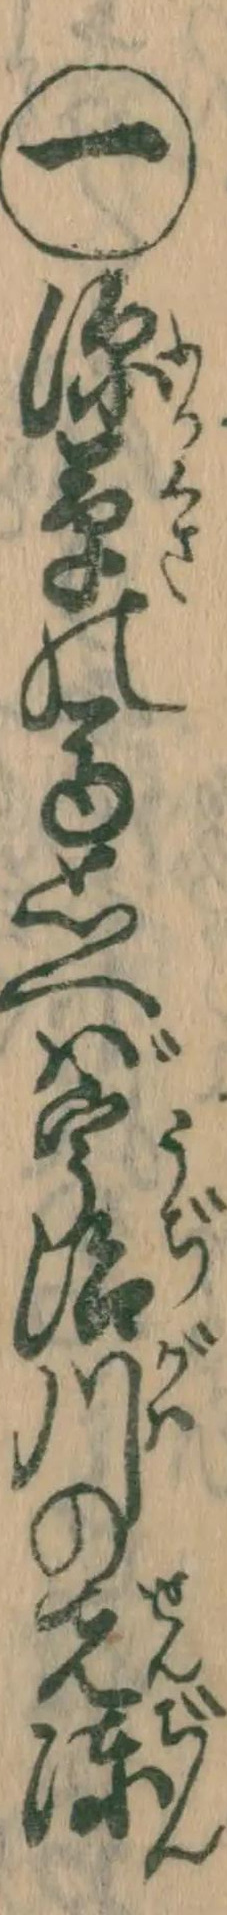一深草の馬思へば宇治川の先陣
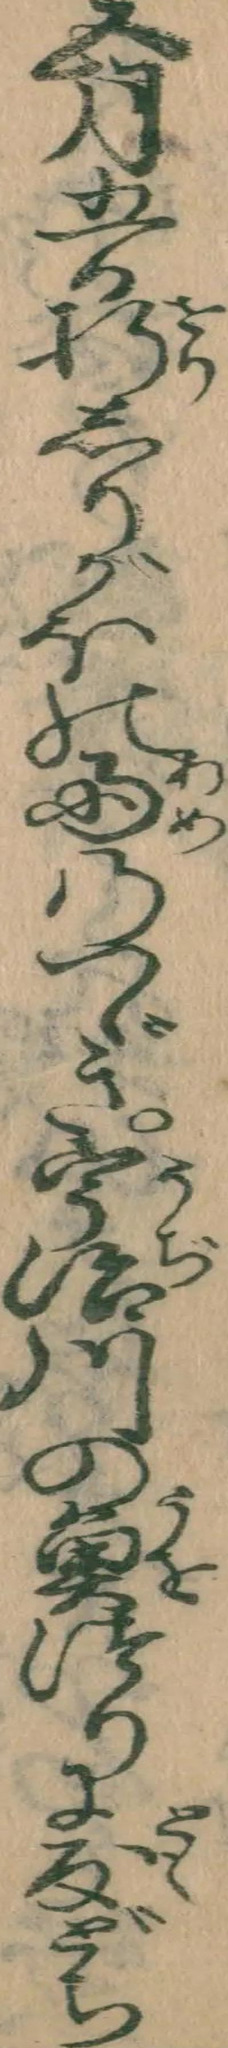五月五日折しりかほの雨のつゞき。宇治川の魚つりに友どち
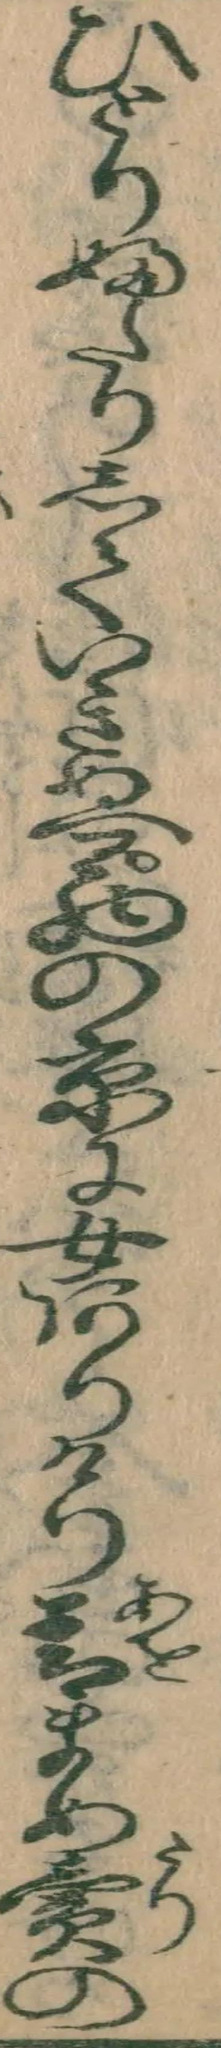ひとりふたりしていきぬへる西の京に女ありけり青まめ売の
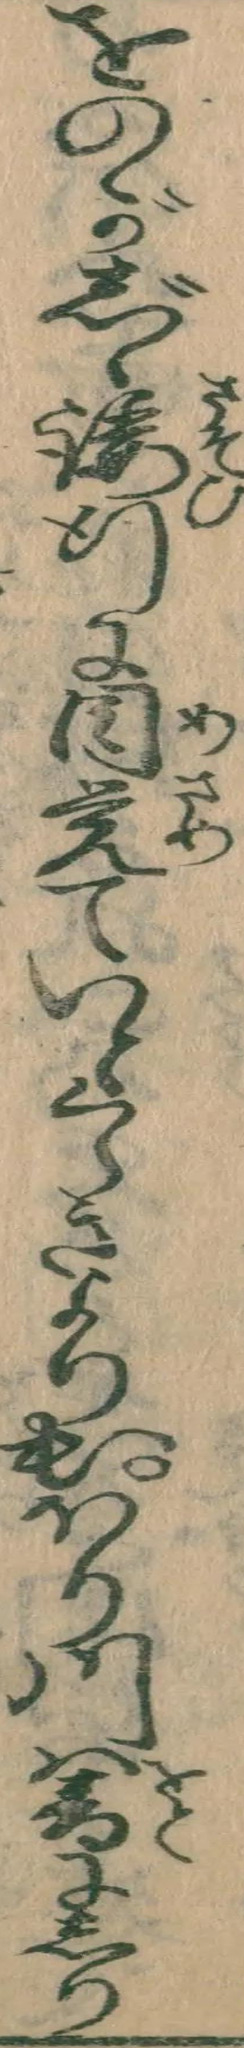をのがじゝ誘行に目覚ていとくらきより出。ほり川は音にしり
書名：新竹斎 5巻
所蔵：国立国会図書館 National Diet Library, JAPAN
